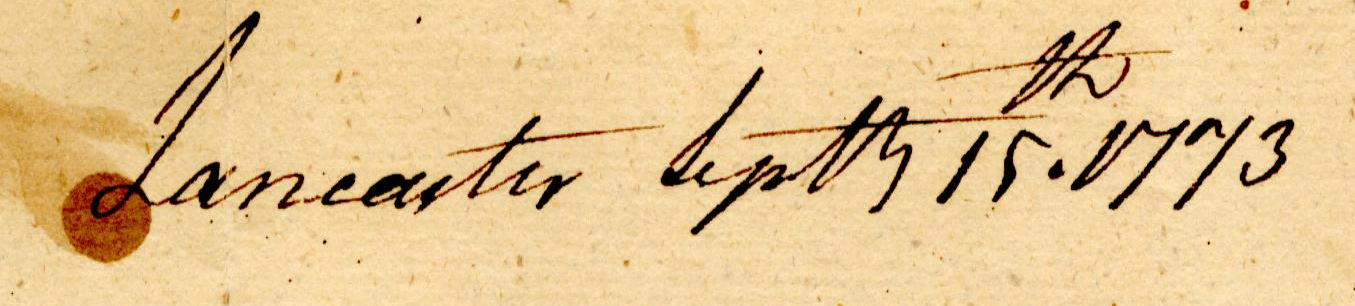Lancaster Sept 15^th. 1773
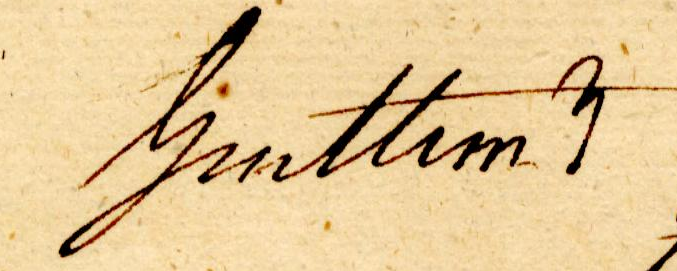Gentlem^n.
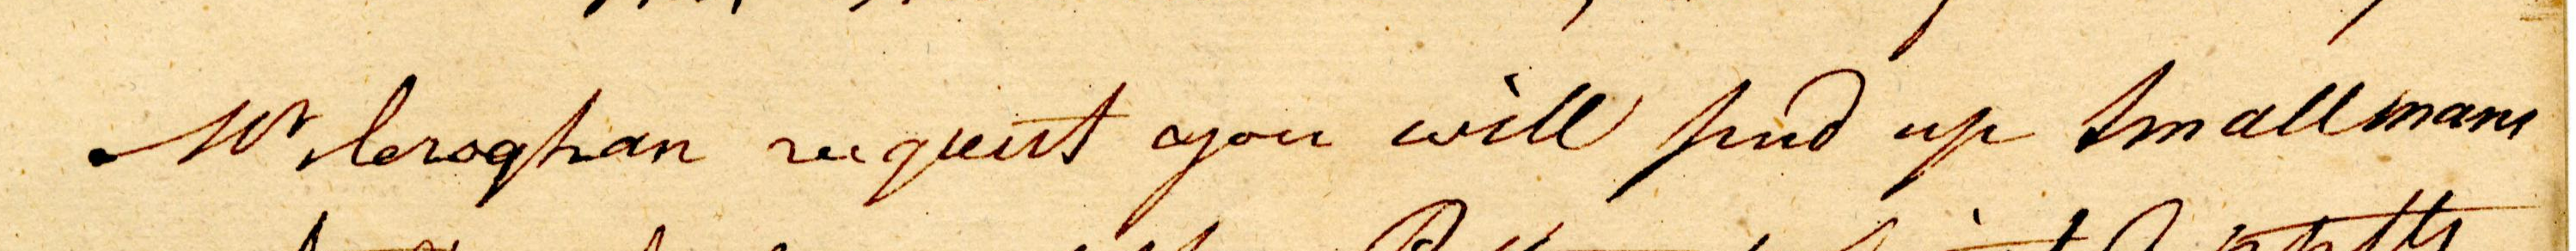M^r Croghan request you will send up Smallmans
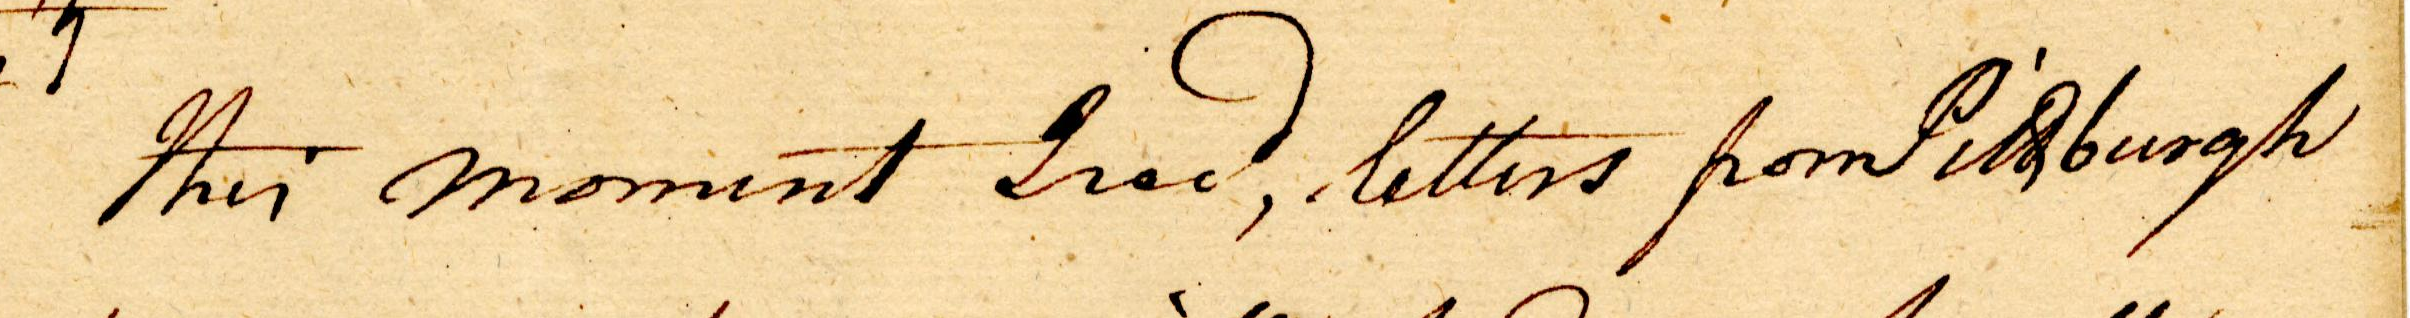This moment I rec^d, letters from Pitdsburgh
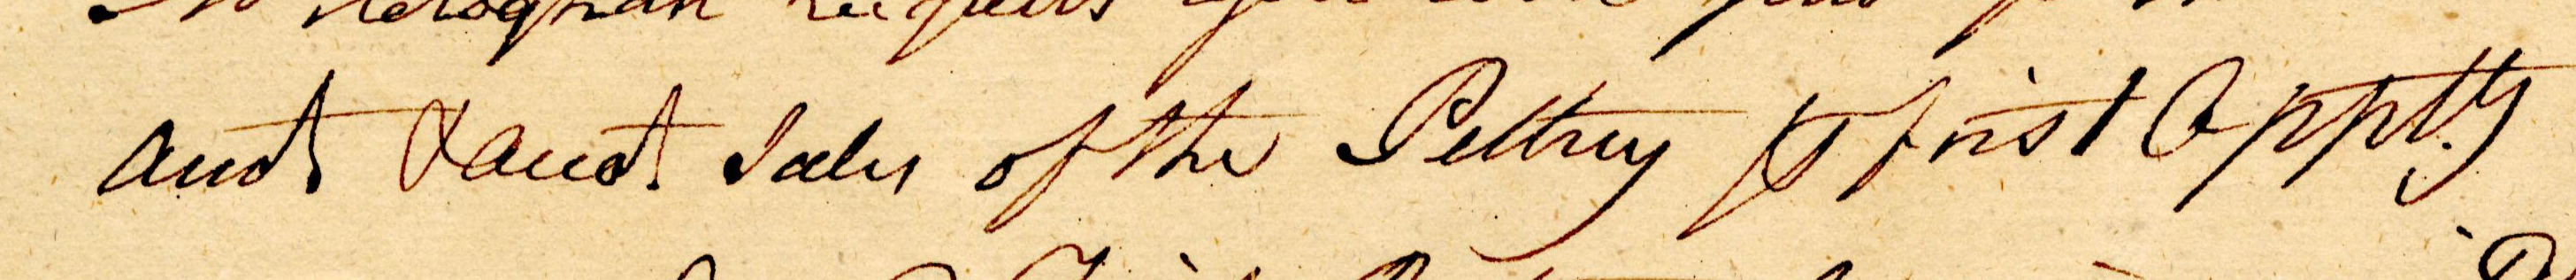Acco^t & acco^t sales of the Peltry per first Opp^ty
